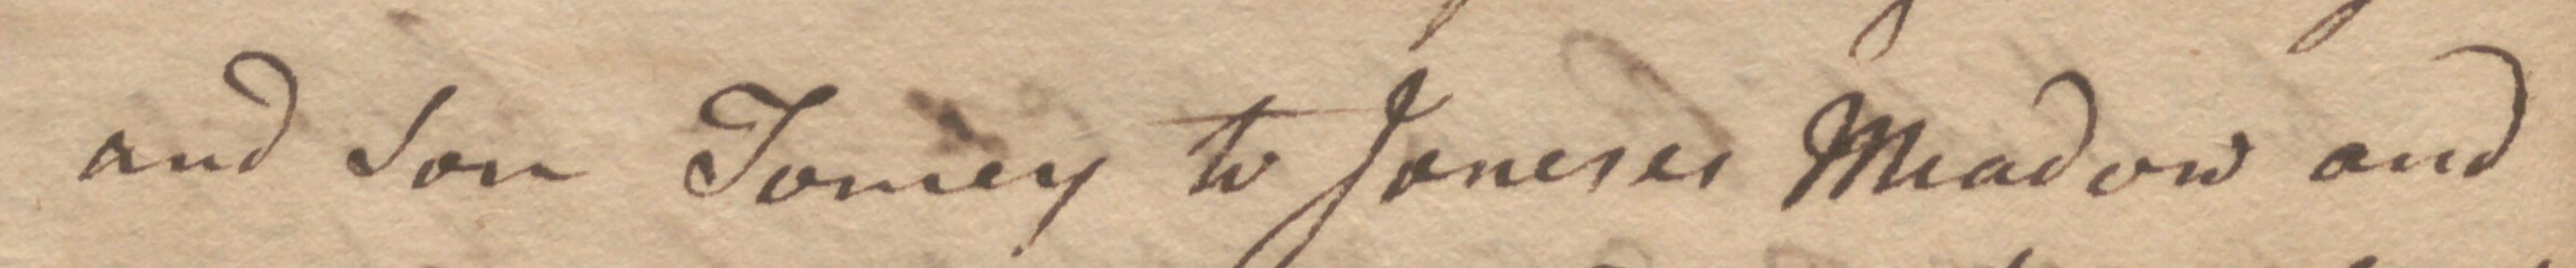and Son Tomey to Joneses Meadow and
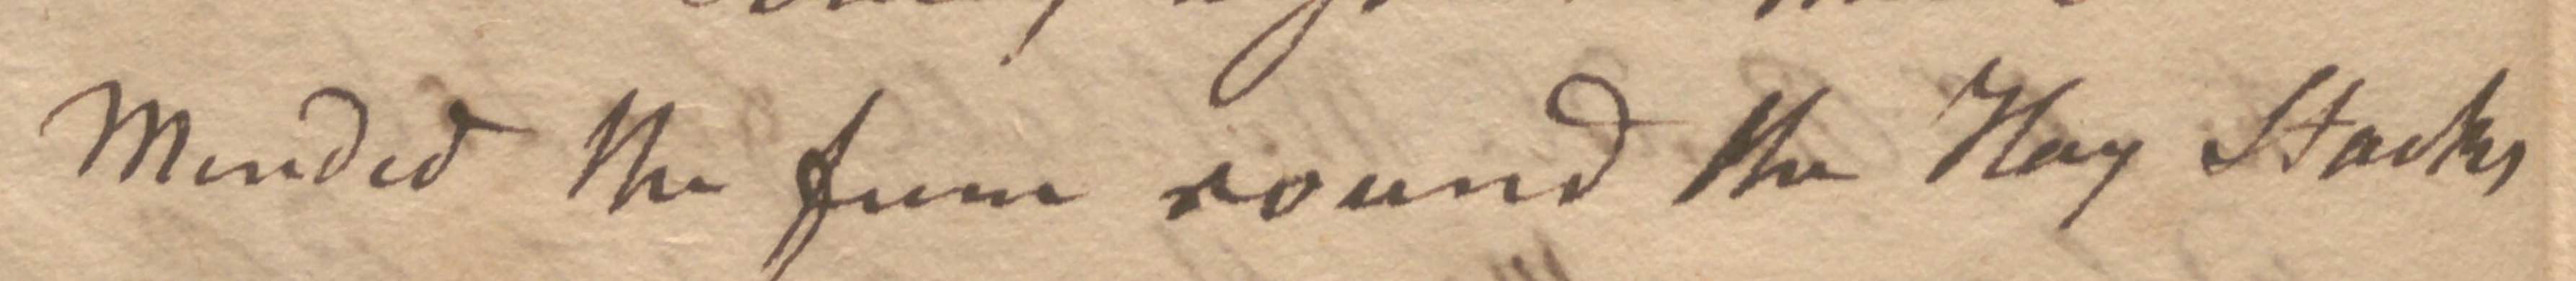Mended the fence round the Hay Stacks
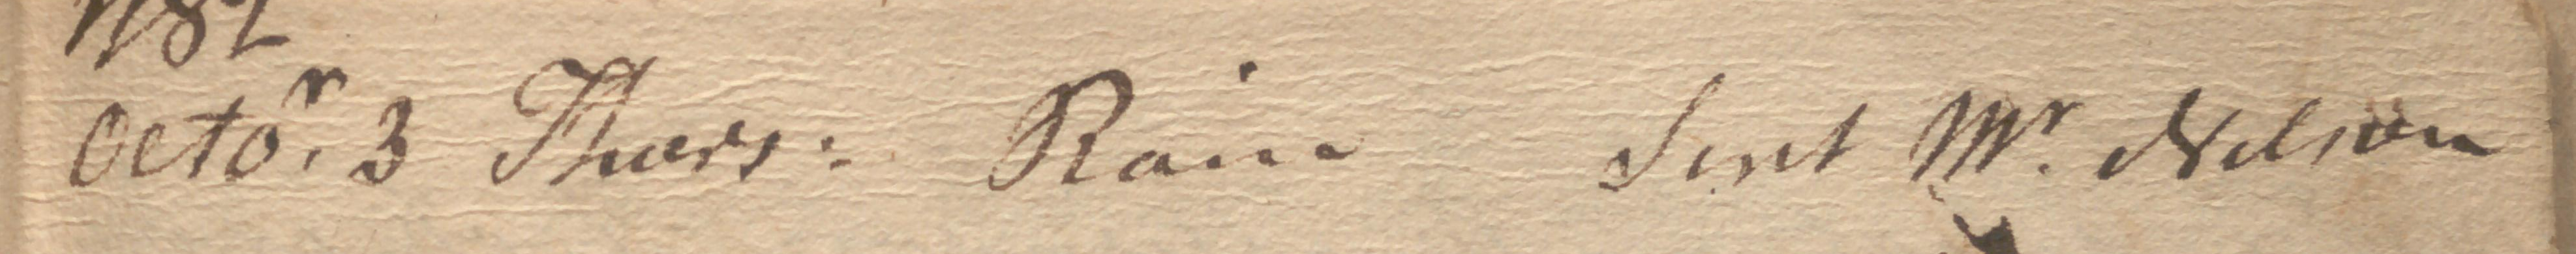Octo^r. 3 Thurs. Rain Sent M^r. Nelson
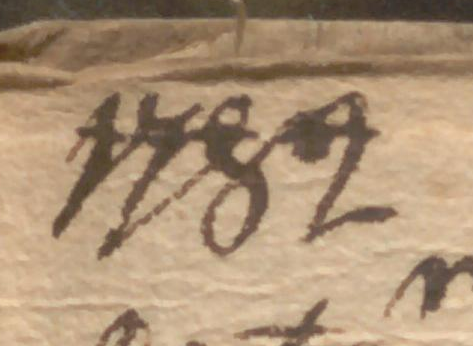1782
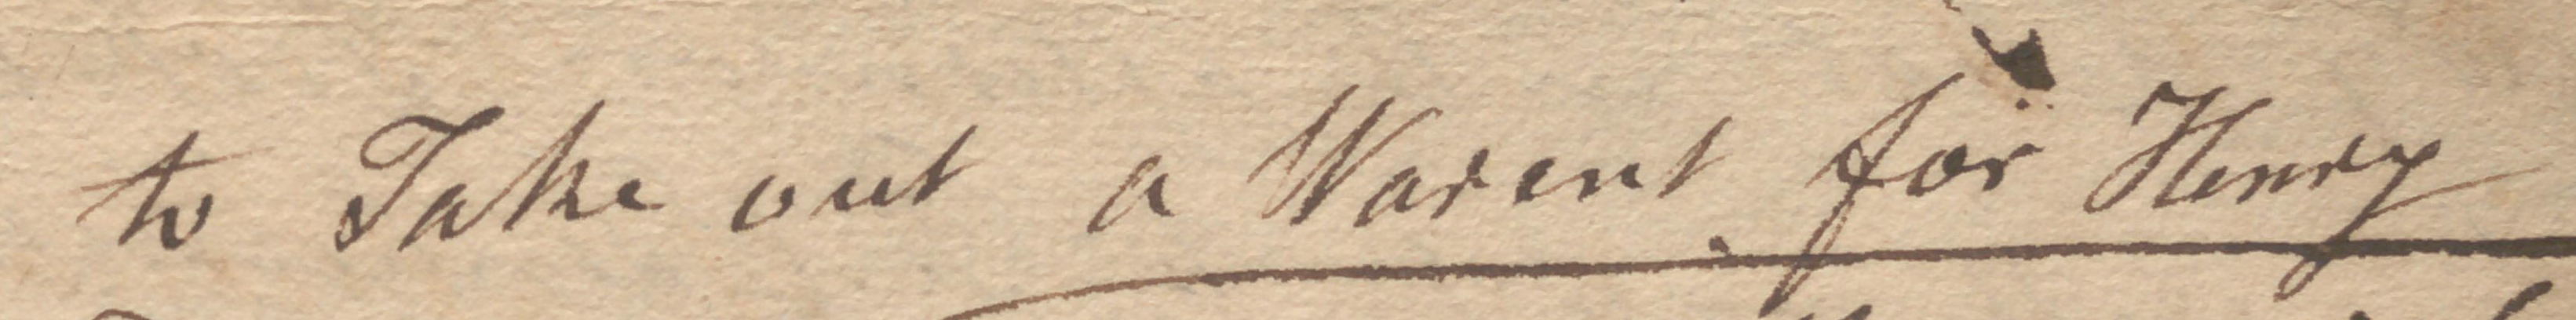to Take out a Warent for Henry
